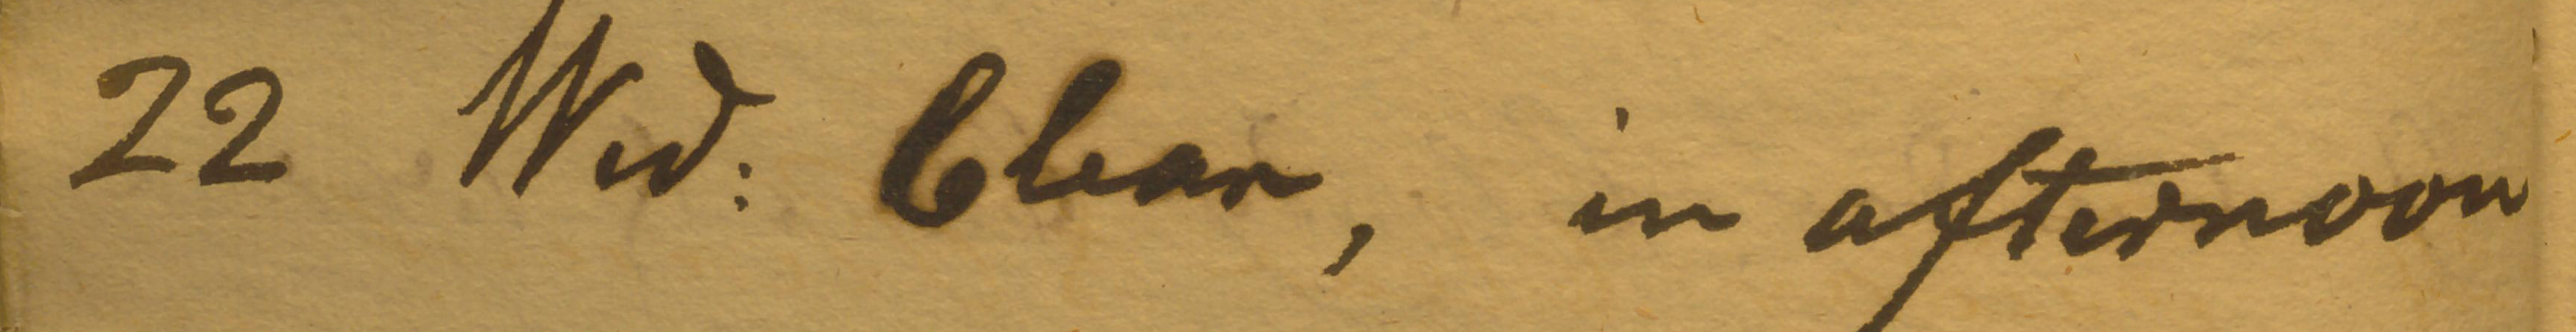22 Wed. Clear, in afternoon
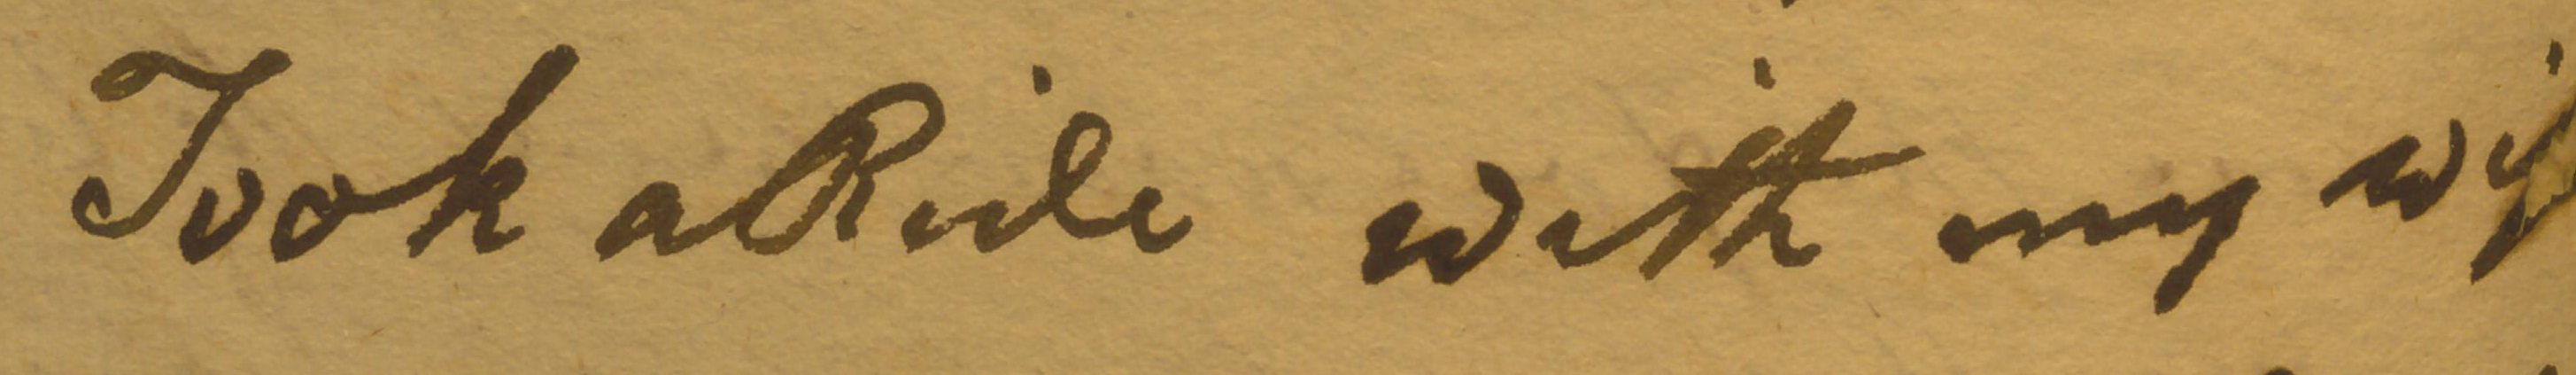Took a Ride with my wife
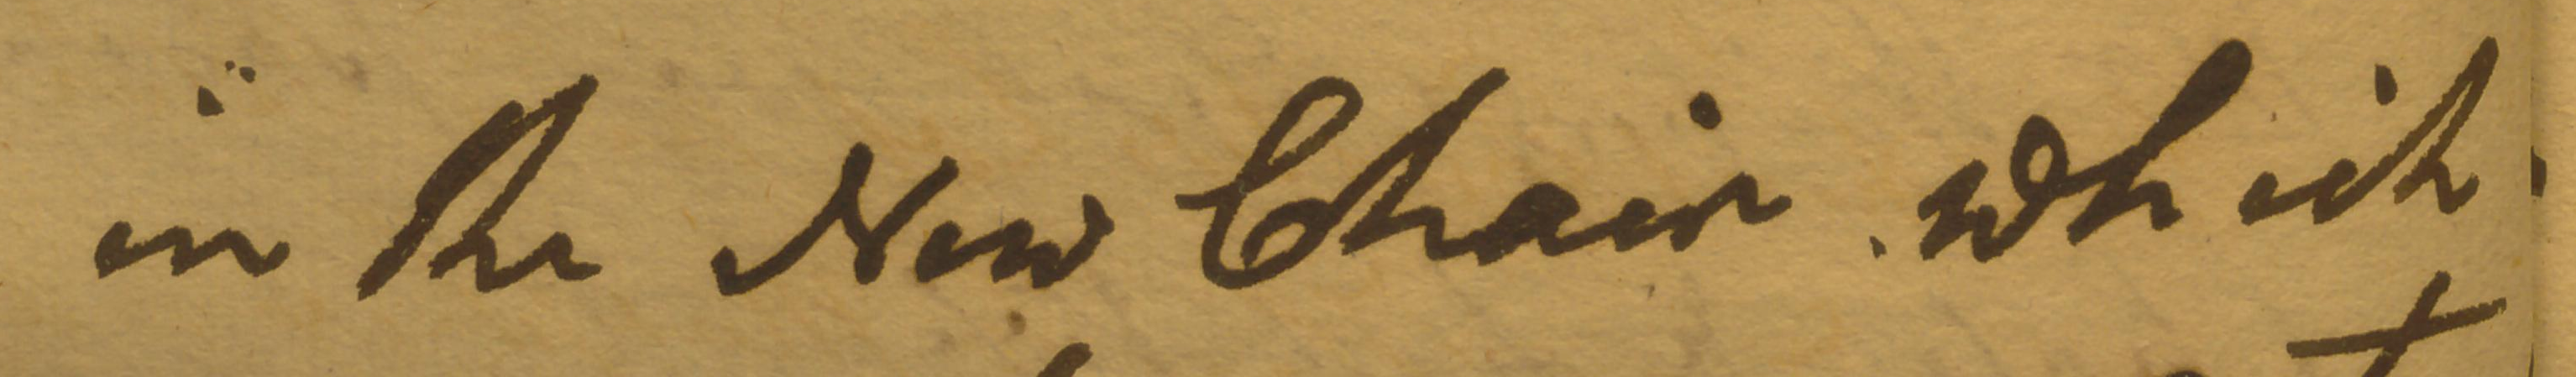in the New Chair which
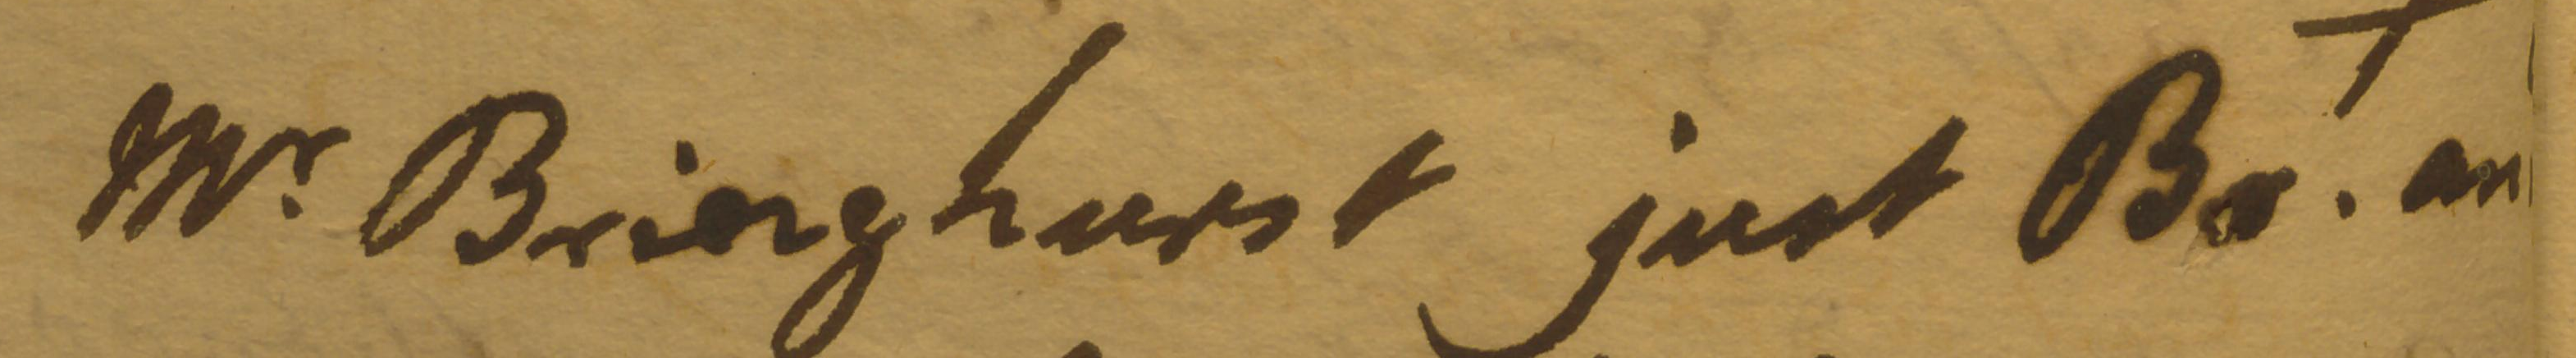M^r. Brinighurst & just Br^t. an
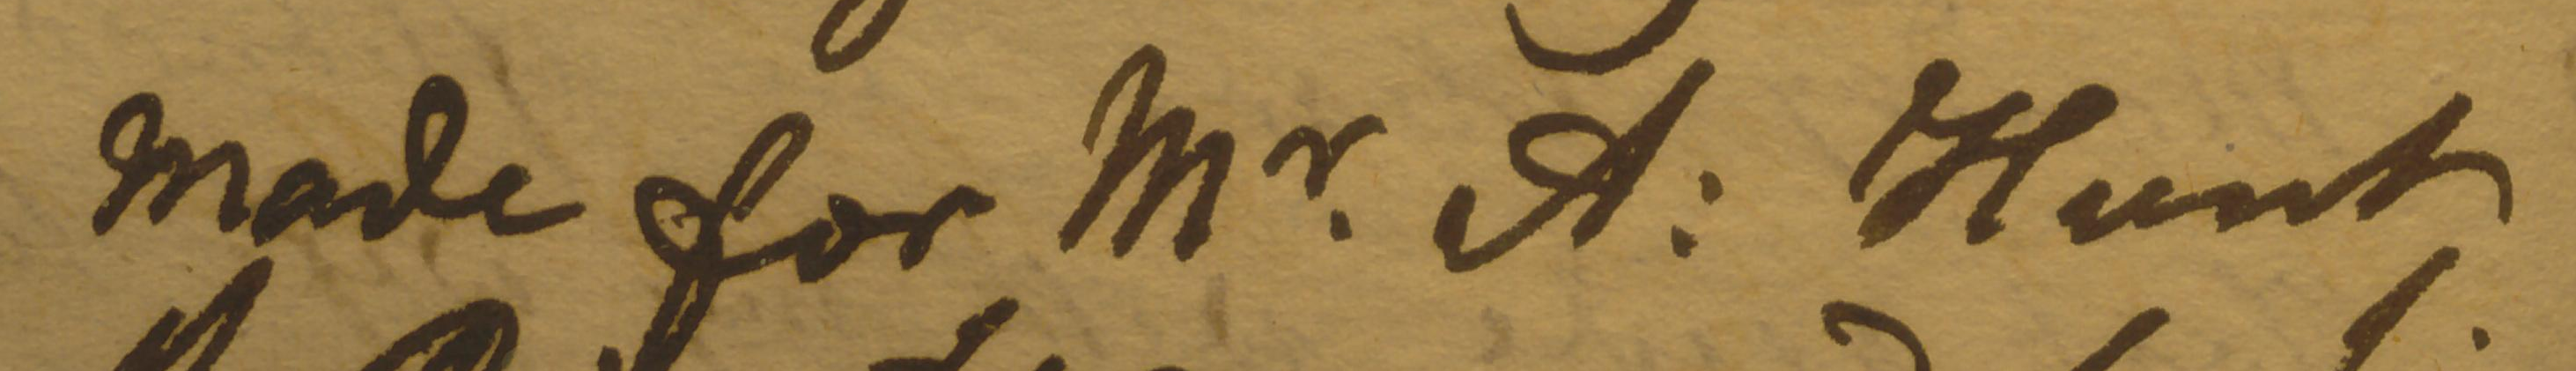made for M^r. A: Hunt
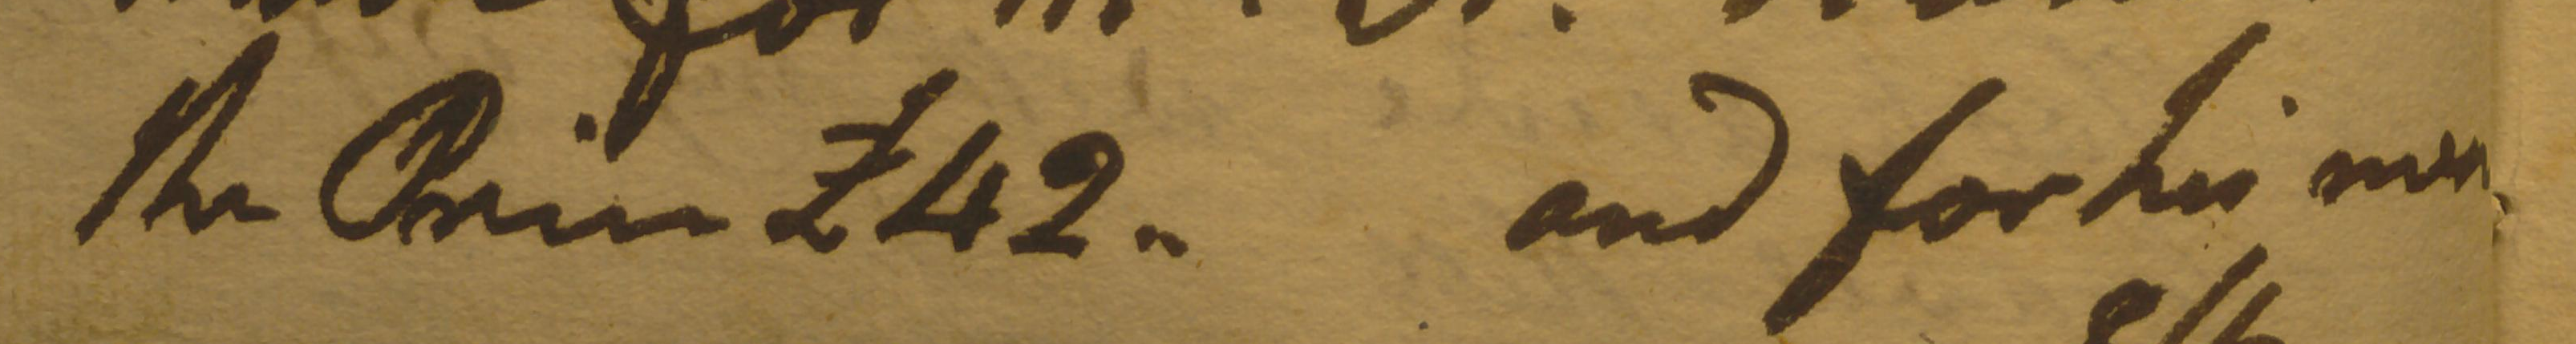the Price £42. and for his men
